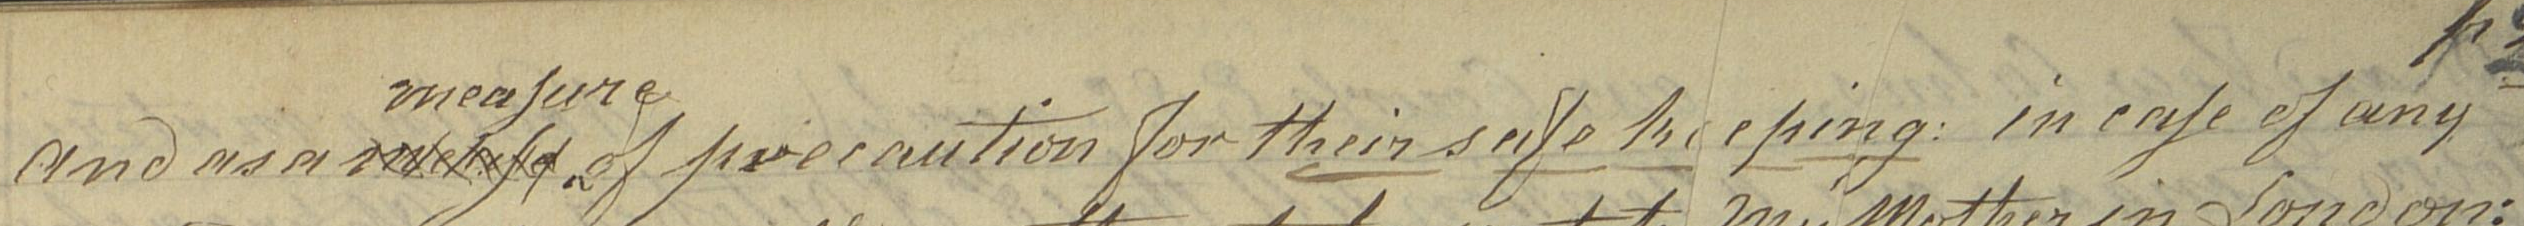and as a meas ^ of precaution for their safe keeping in case of any
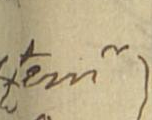tem^r
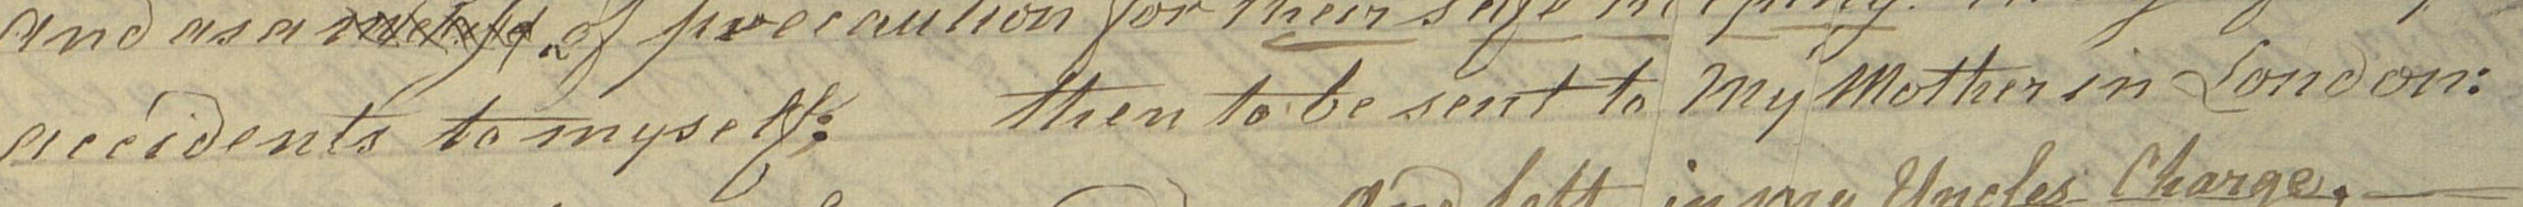accidents to myself; then to be sent to My Mother in London:
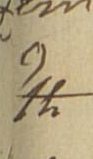^th
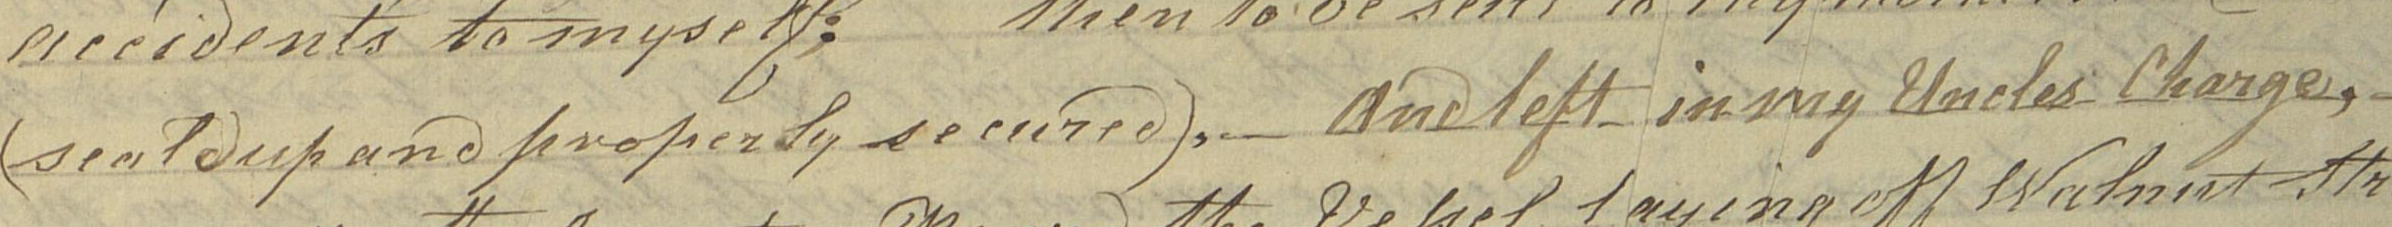(seald up and properly secured).- And left in my Uncles Charge,
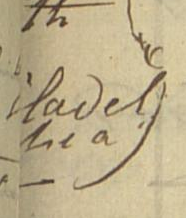ladel
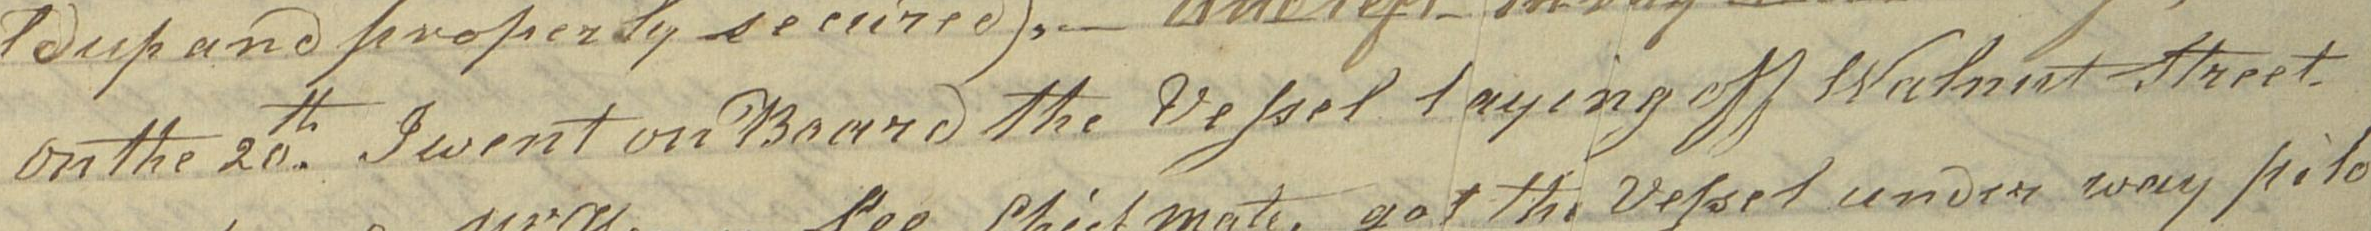on the 20^th. I went on Board the Vessel laying off Walnut Street
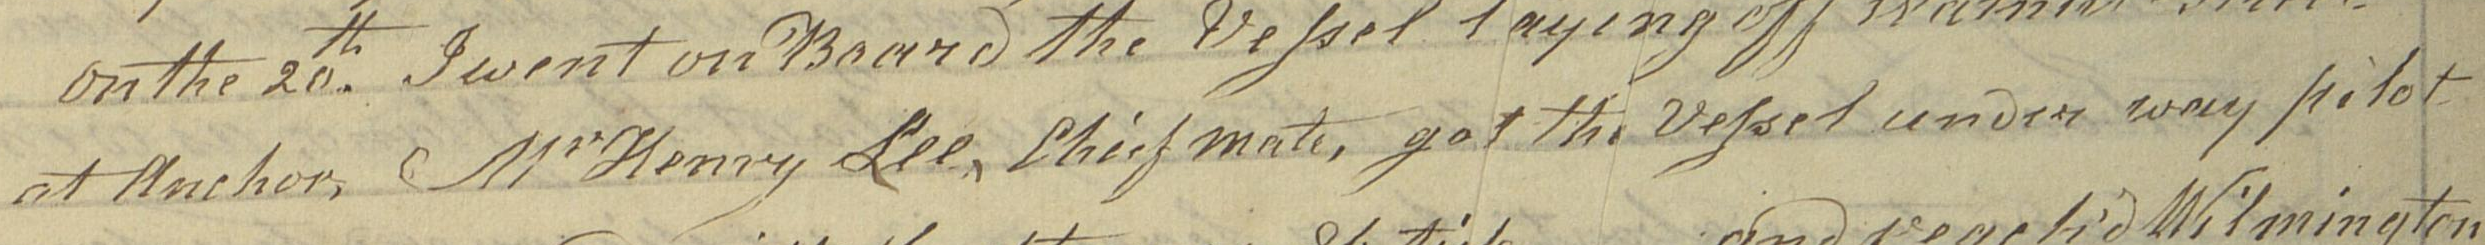at Anchor, M^r. Henry Lee, Chief mate, got the Vessel under way pilot
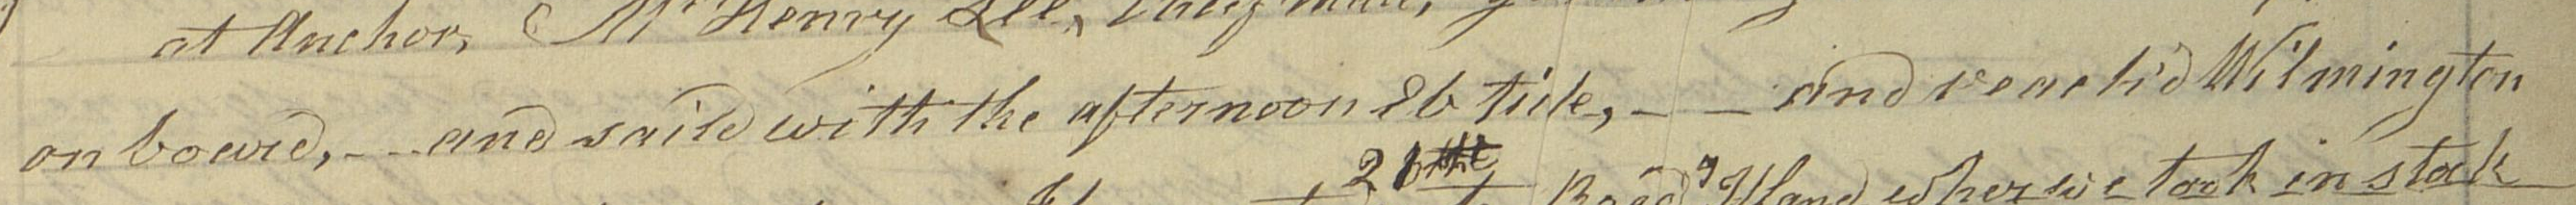on board, and saild with the afternoon Eb Tide, and reach'd WiImington
